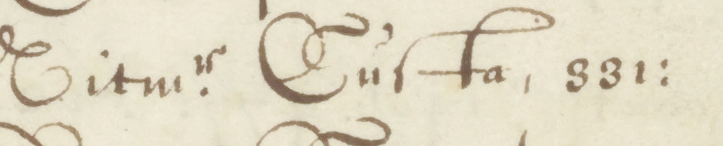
Ritmr. Custa, 331:
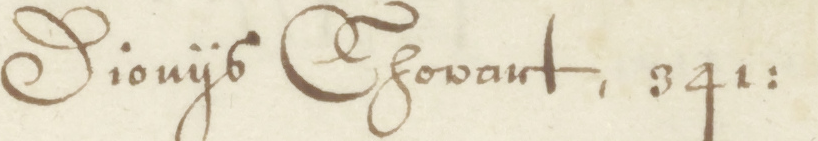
Dionijs Chovart, 341:
